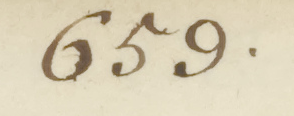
659.
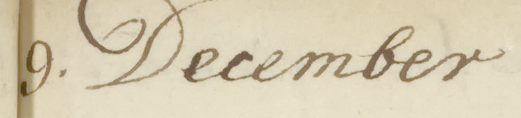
9. December
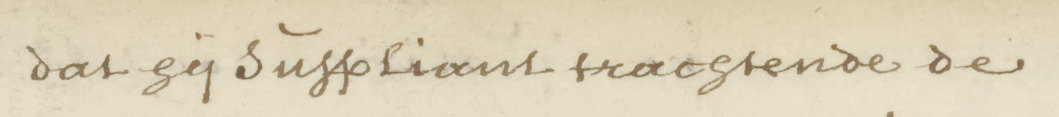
dat hij suppliant trachtende de
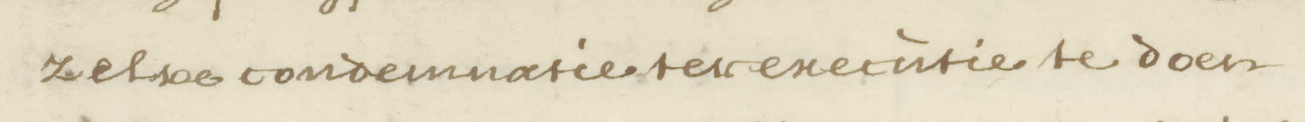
zelve condemnatie ter executie te doen
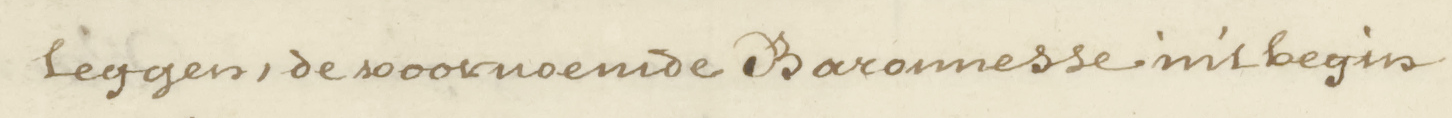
leggen, de voornoemde Baronnesse te begin
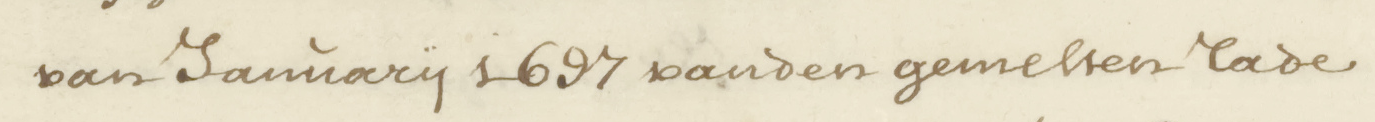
van Januarij 1697 vanden gemelten Rade
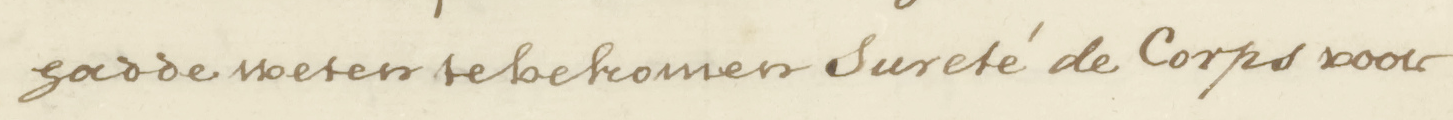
hadde weten te bekomen Surete' de Corps voor
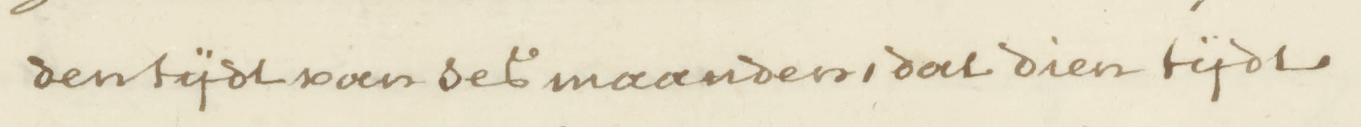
den tijdt van ses maanden, dat dien tijdt
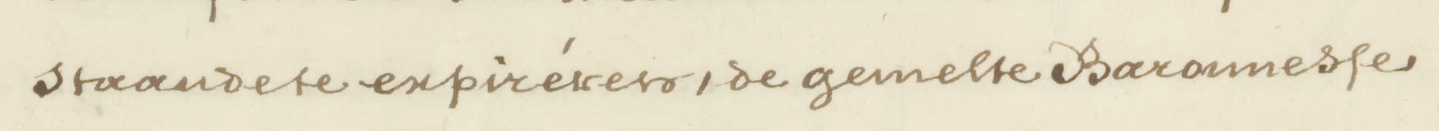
staande te expireren, de gemelte Baronnesse
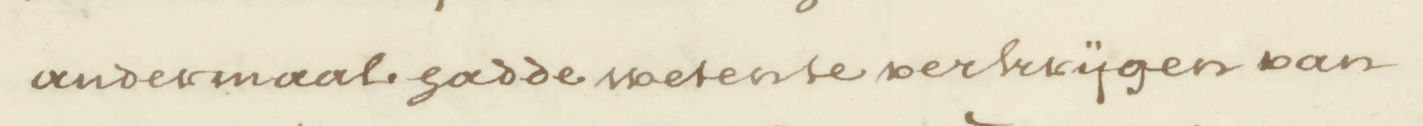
andermaal hadde weten te verkrijgen van
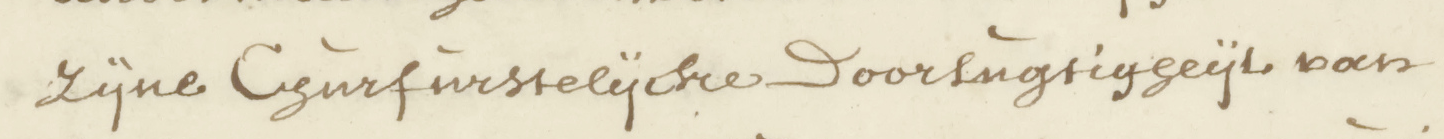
zijne Churfurstelijcke Doorlugtigheijt van
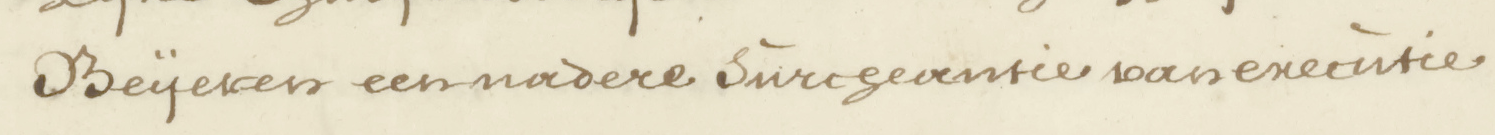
Beijeren een nadere surcheantie van executie
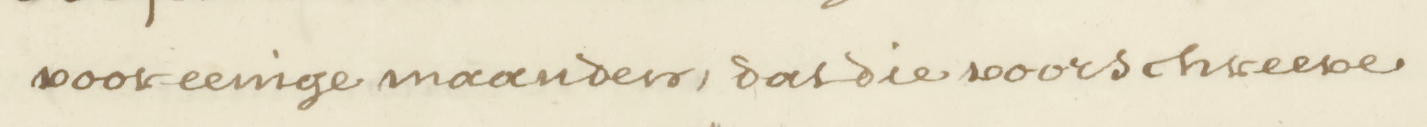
voor eenige maanden, dat die voorschreeve
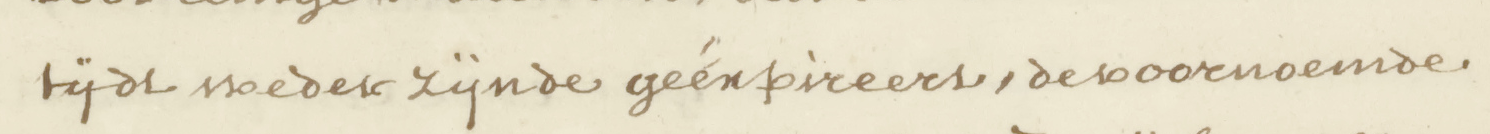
tijdt weder zijnde geexpireert, de voornoemde
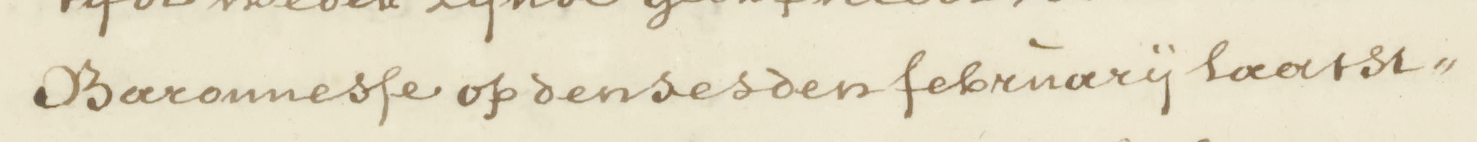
Baronnesse op den sesden februarij laatst„
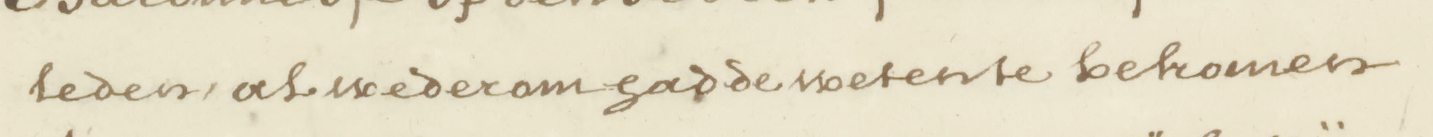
leden, al wederom hadde weten te bekomen
